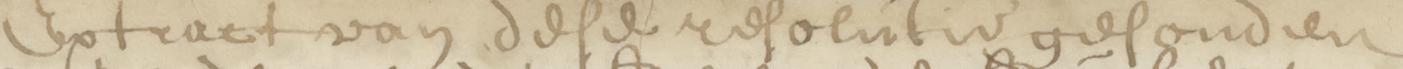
Extract van dese resolutie gesonden
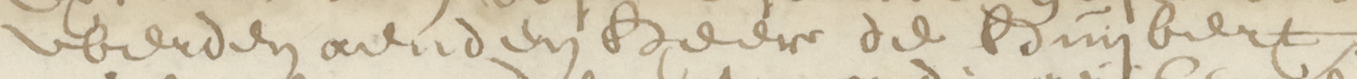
werden aenden Heer de Huijbert
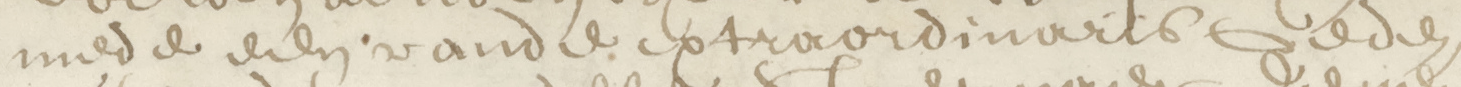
mede een vande Extraordinaris Gede„
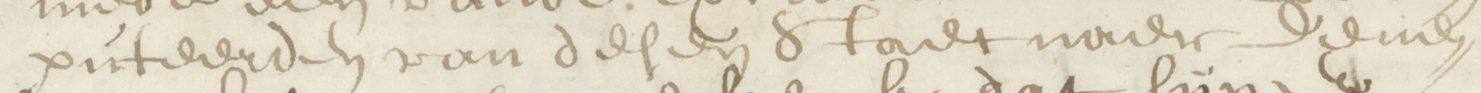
puteerden van desen Staet naer Dene„
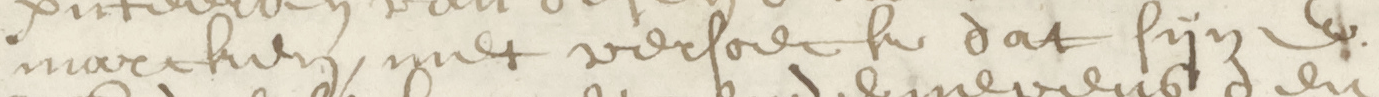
marcken, met versoeck dat sijn E.
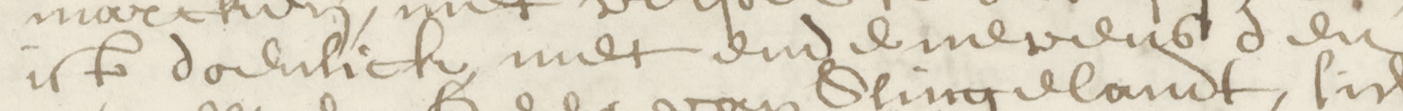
ist doenlick, met ende nevens den
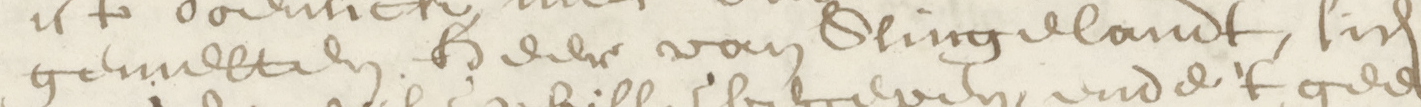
gemelten Heer van Slingelandt, sich
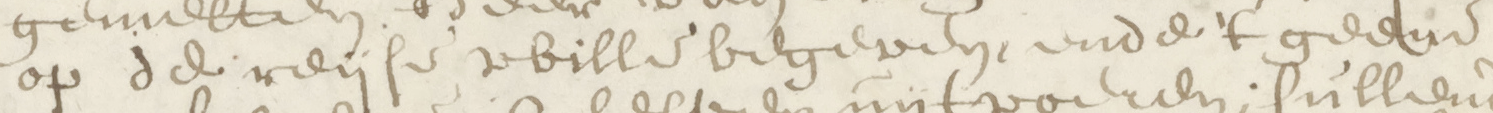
op de reijse wille begeven, ende 't geene
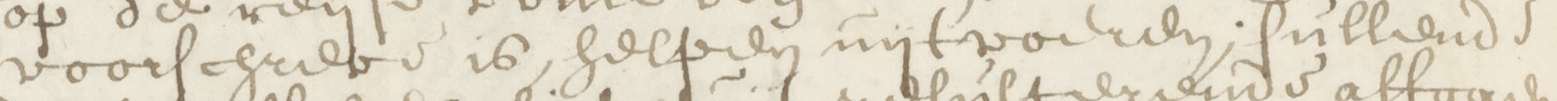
voorschreve is, helpen uijtvoeren, sullende
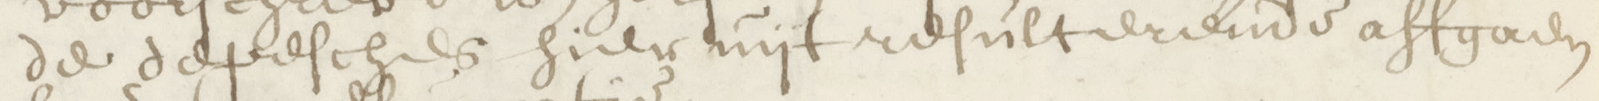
de depesches hier uijt resulterende affgaen
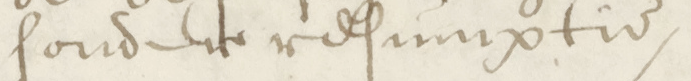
sonder resumptie.
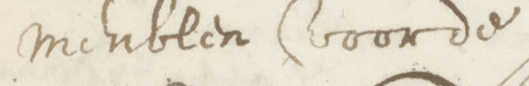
meublen voorde
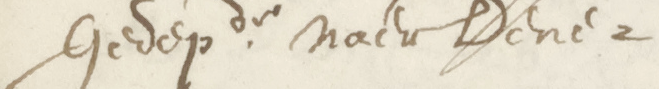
Gedepden. naer Dene„
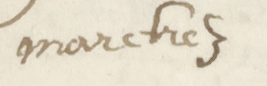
marcken
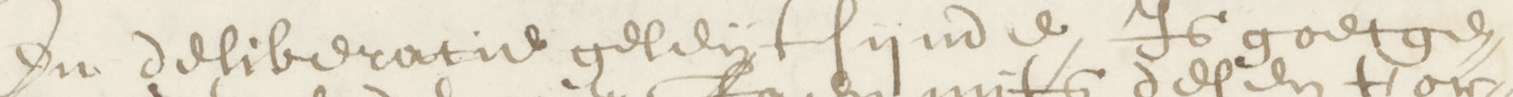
In deliberatie geleijt sijnde, Is goetge„
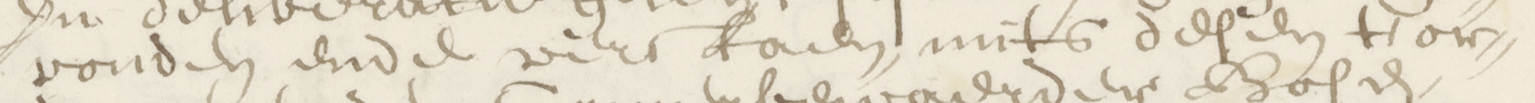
vonden ende verstaen, mits desen t‛or„
